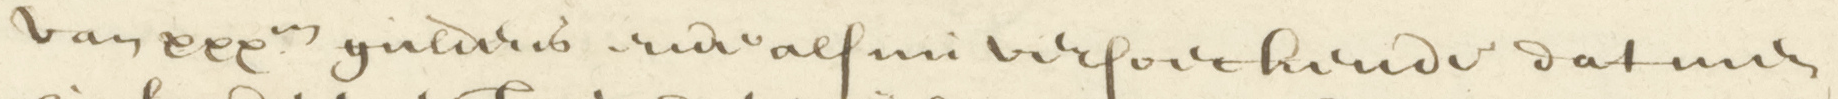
van xxxm guldens ende alsnu versoeckende dat men
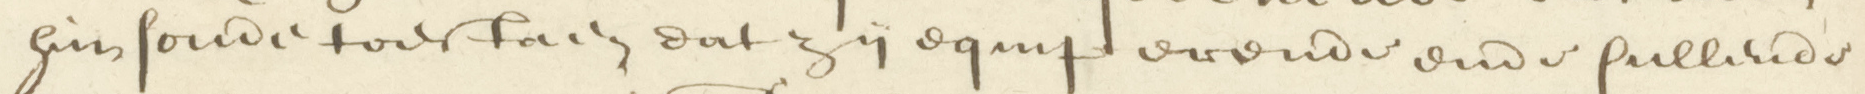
hun soude toestaen dat zij equiperende ende sullende
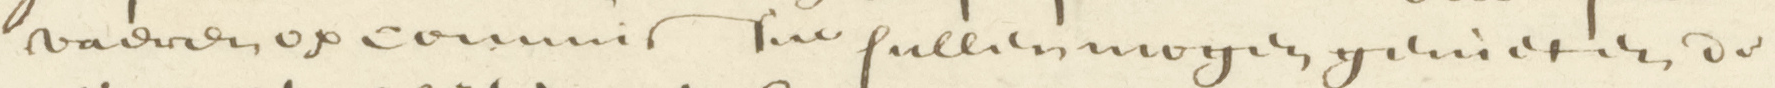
vaeren op commissie sullen mogen genieten de
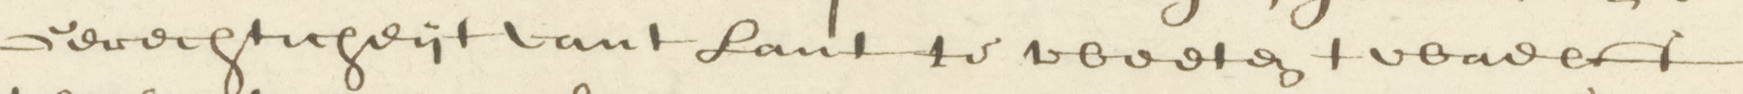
Gerechticheijt vant Lant te weeten twaelff
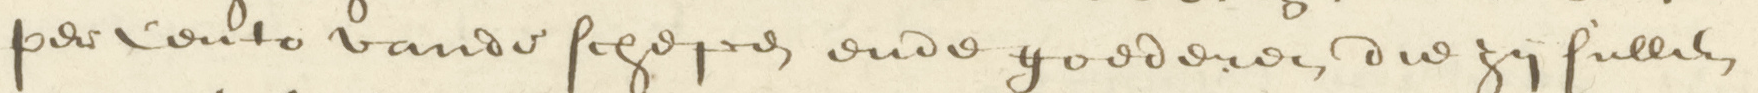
per cento vande schepen ende goederen die zij sullen
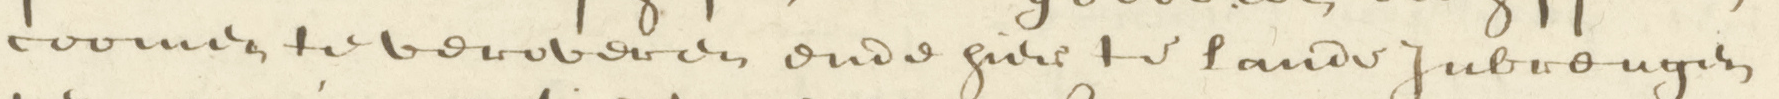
coomen te veroveren ende hier te lande inbrengen
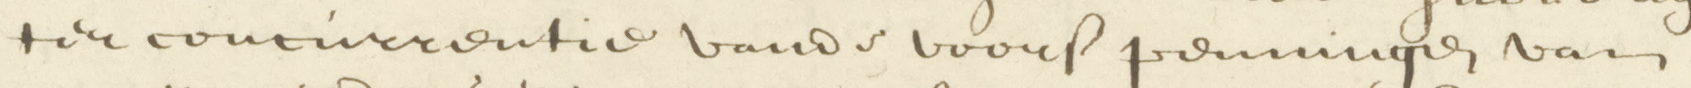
ter concurrentie vande voors penningen van
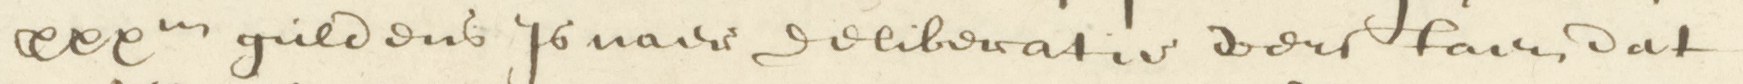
xxxm guldens Is naer deliberatie verstaen dat
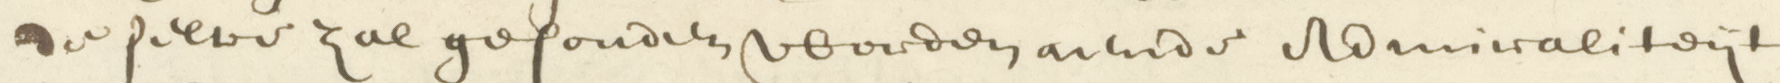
de selve zal gesonden worden aende Admiraliteijt
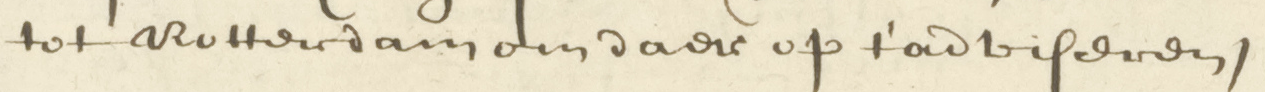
tot Rotterdam om daer op t'adviseren.
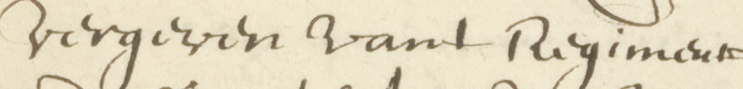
Vergeven vant Regiment
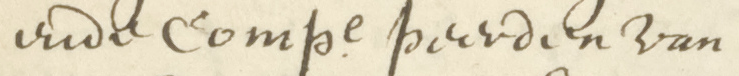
ende Compe peerden van
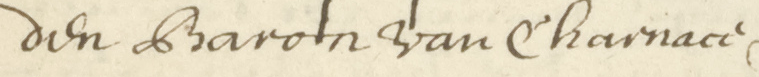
den Baron van Charnace
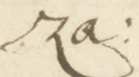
za:
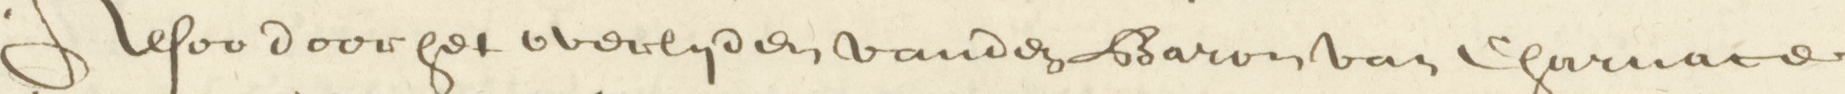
Alsoo door het overlijden vanden Baron van Charnace
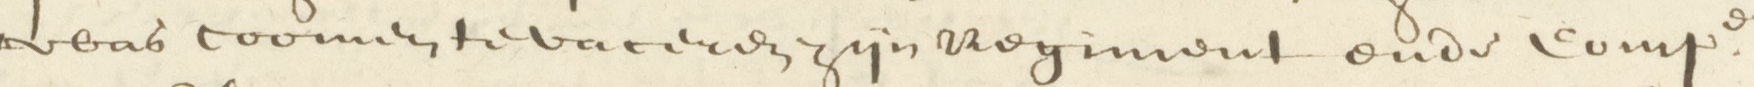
was coomen te vaceren zijn Regiment ende Compe
